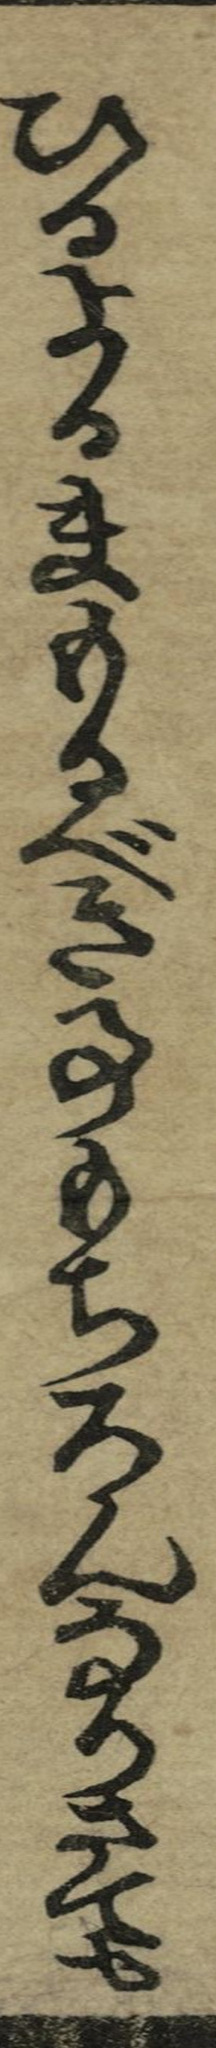ひるよるまもるべき事もちろんなりさても
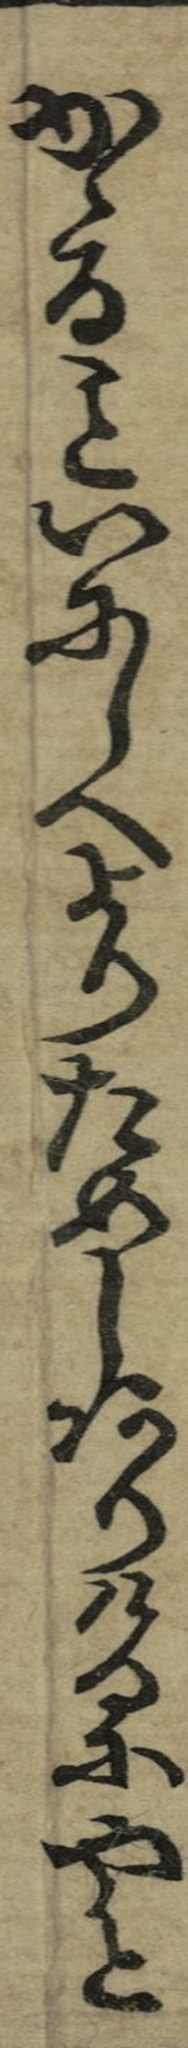かゝることいにしへよりためしありけるにやと
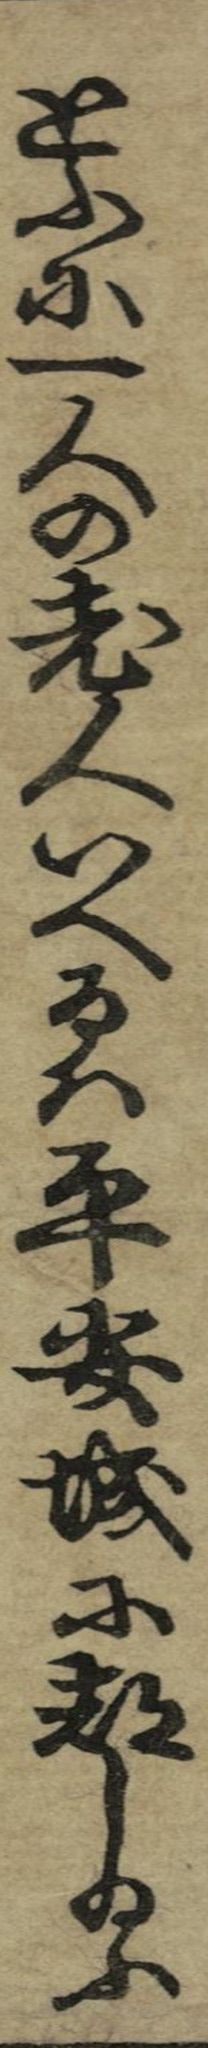とふに一人の老人いへるハ平安城に都し為ふ
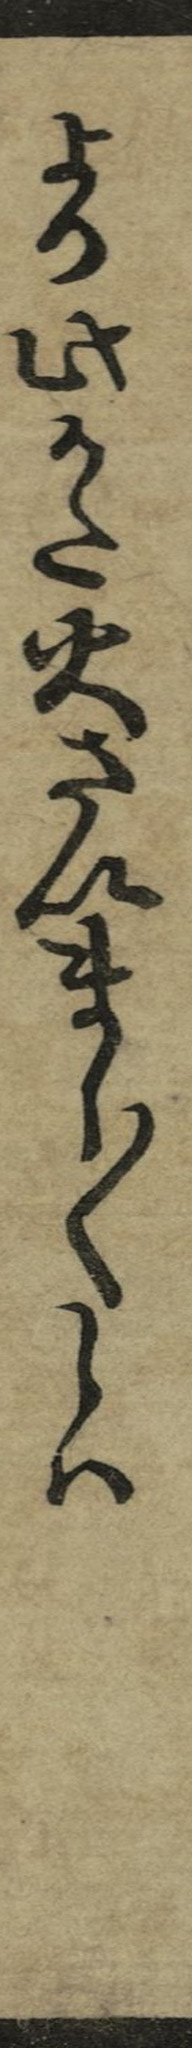より此かた火さいまし〳〵しハ
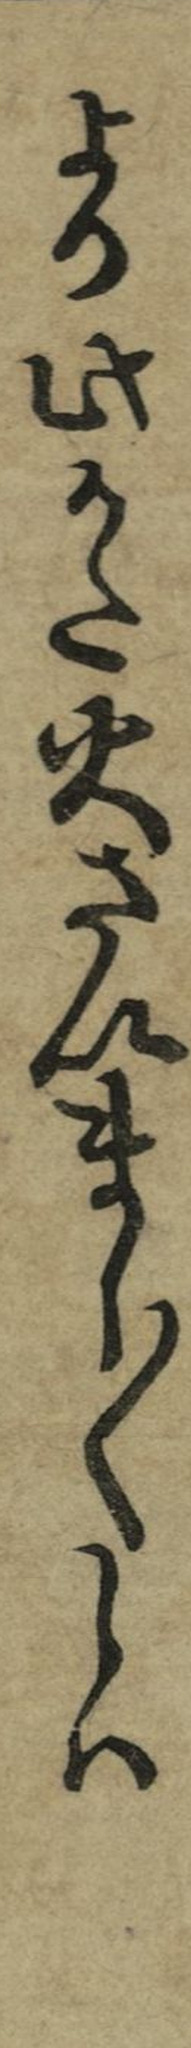より此かた火さいまし〳〵しハ
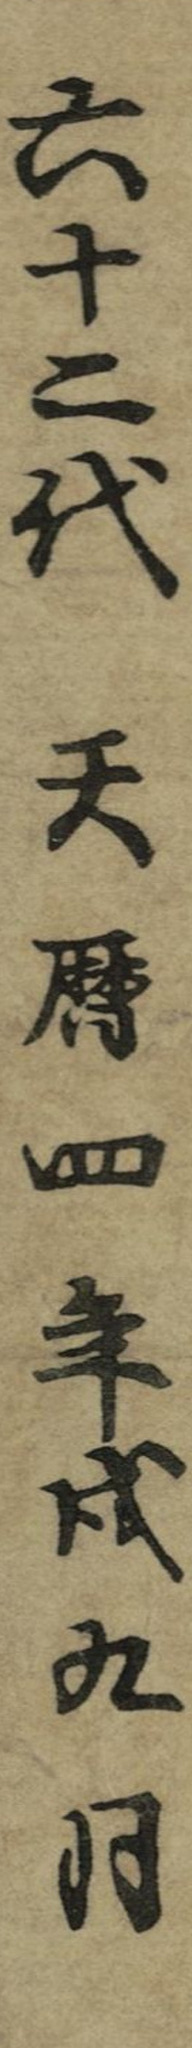六十二代天暦四年戌九月
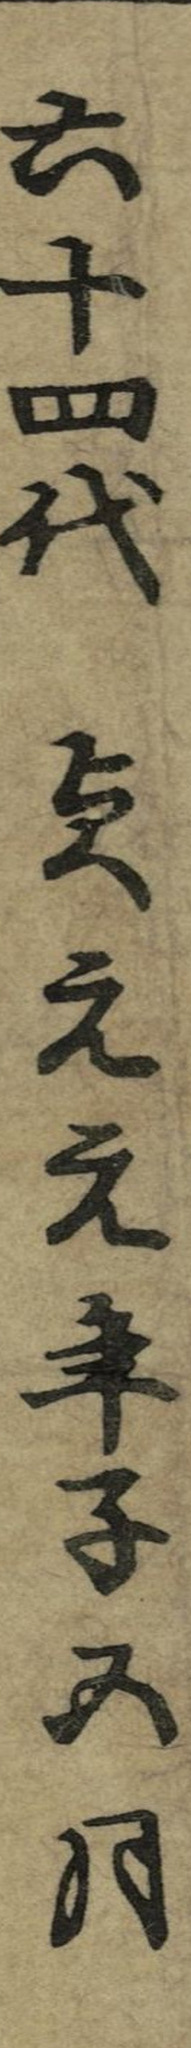六十四代貞元元年子五月
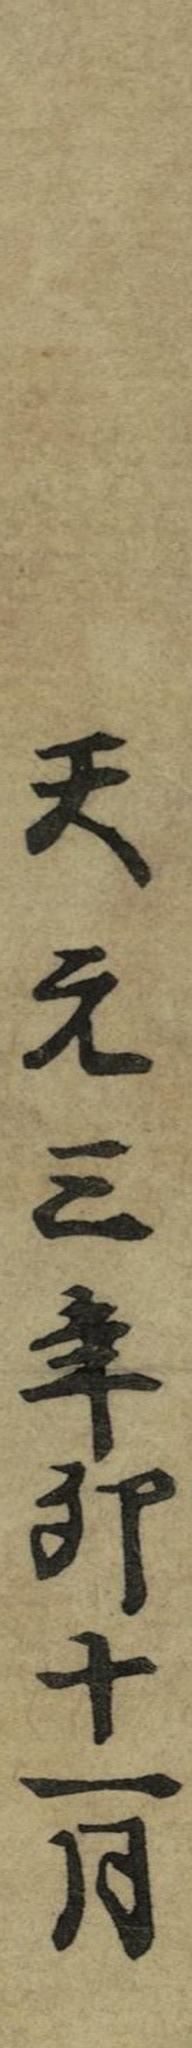天元三年卯十一月
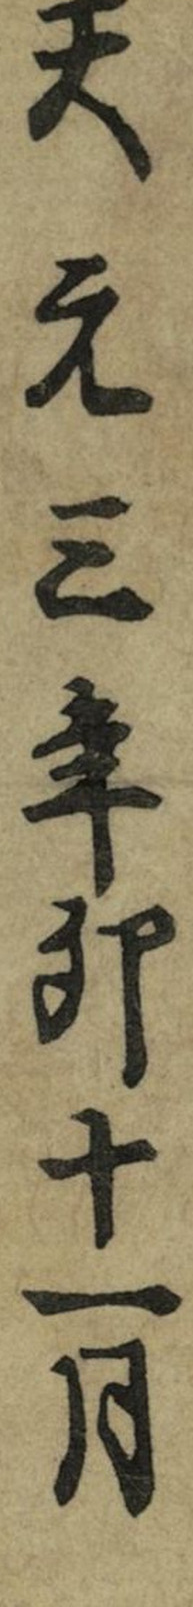天元三年卯十一月
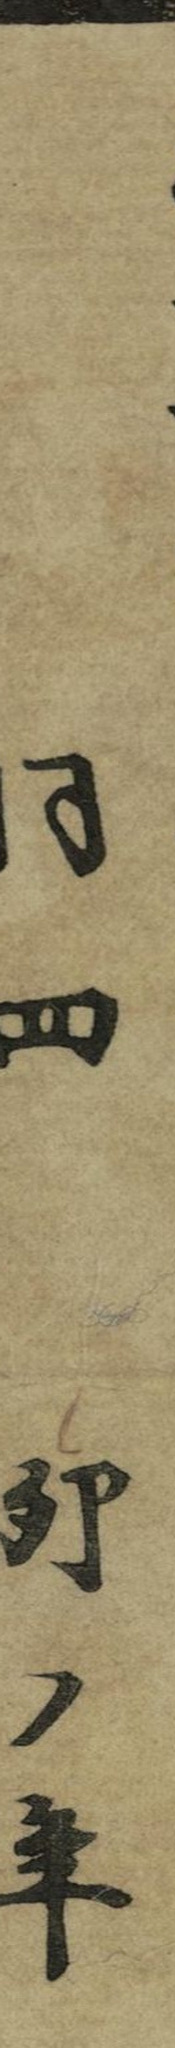同四卯ノ年
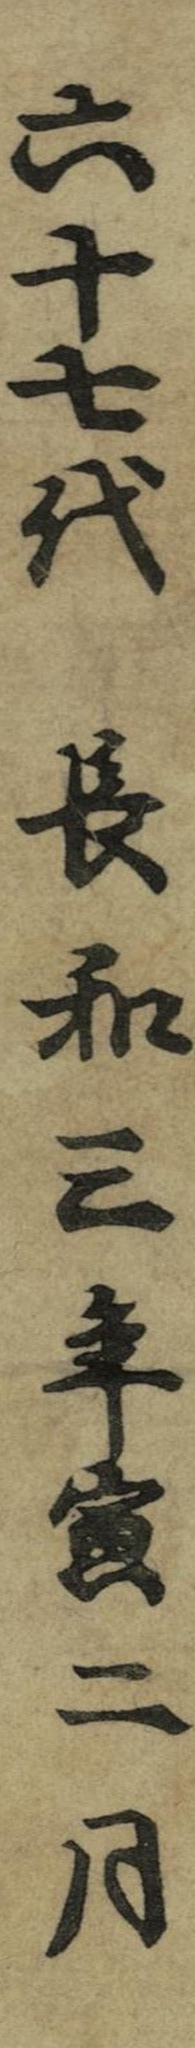六十七代長和三年寅二月
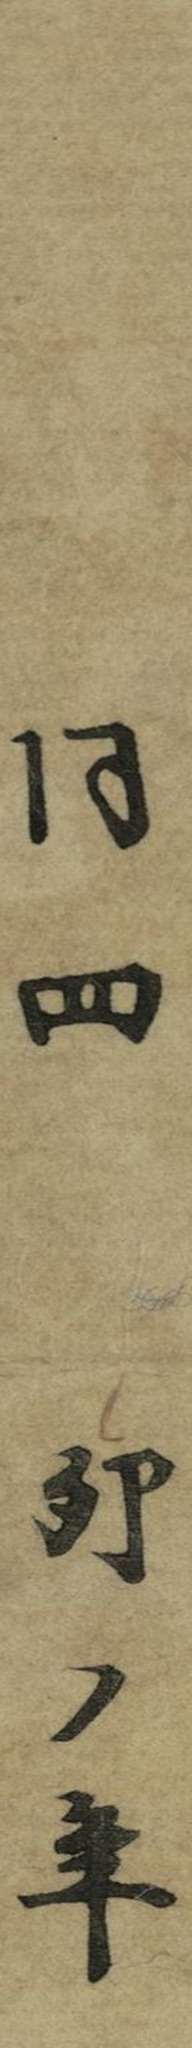同四卯ノ年
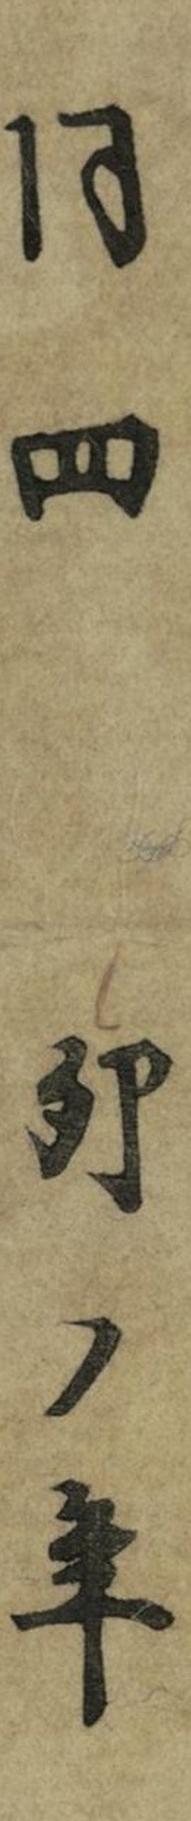同四卯ノ年
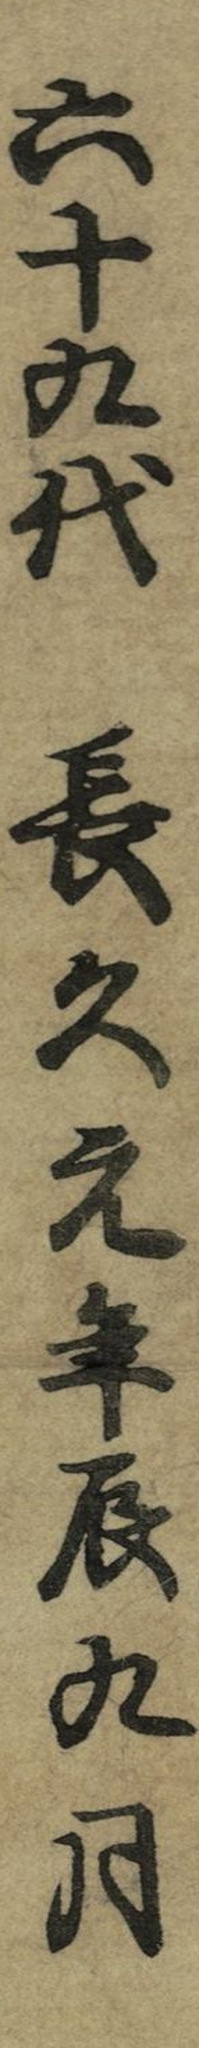六十九代長久元年辰九月
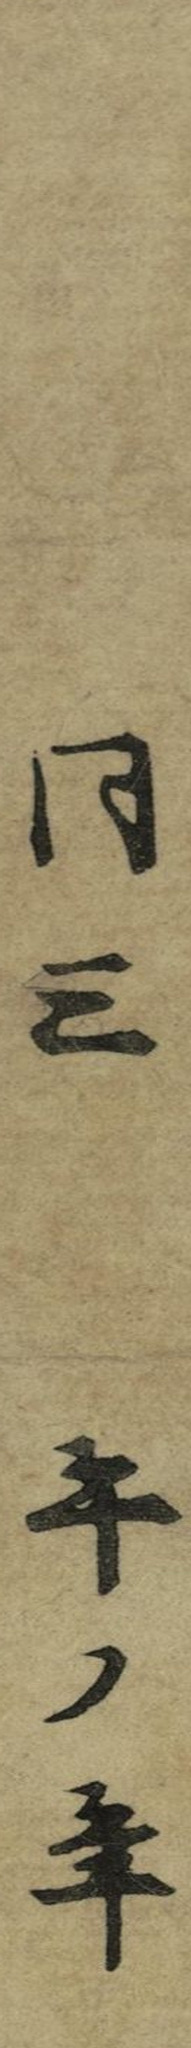同三午ノ年
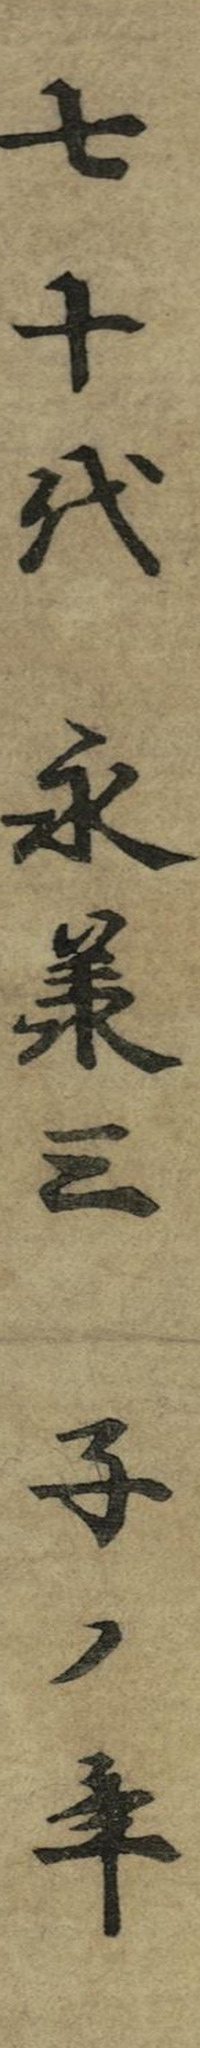七十代永承三子ノ年
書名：京都近世大火畧圖
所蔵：東京大学地震研究所図書室 Earthquake Research Institute Library, The University of Tokyo, JAPAN
